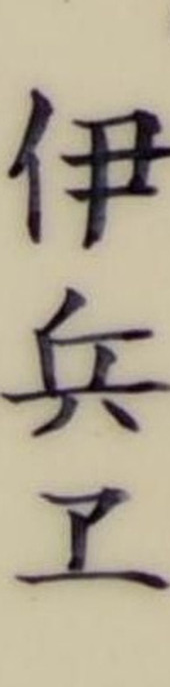伊兵エ
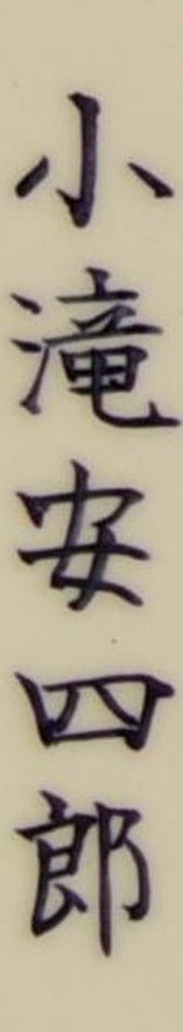小滝安四郎
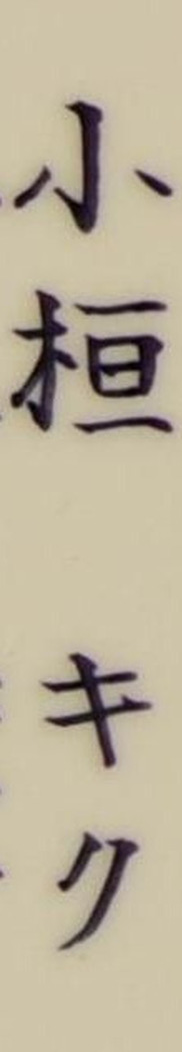小桓キク
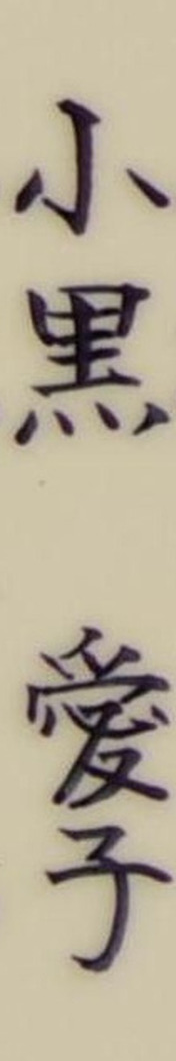小黒愛子
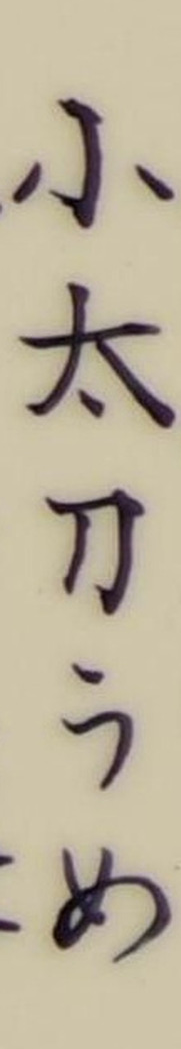小太刀うめ
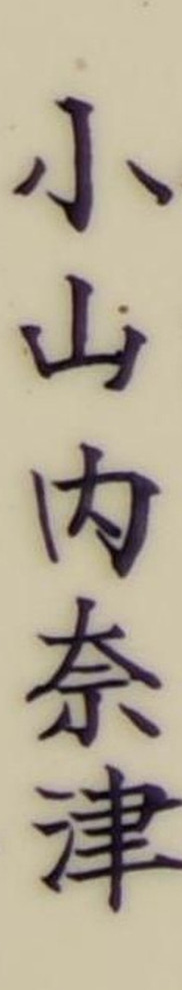小山内奈津
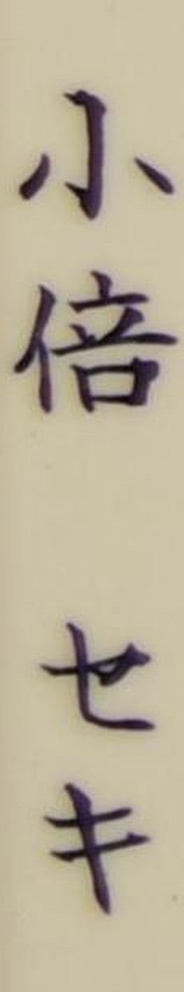小倍セキ

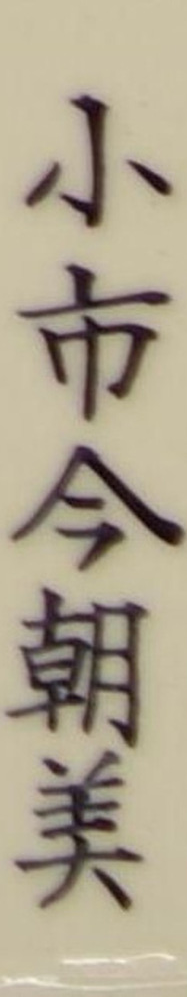小市今朝美
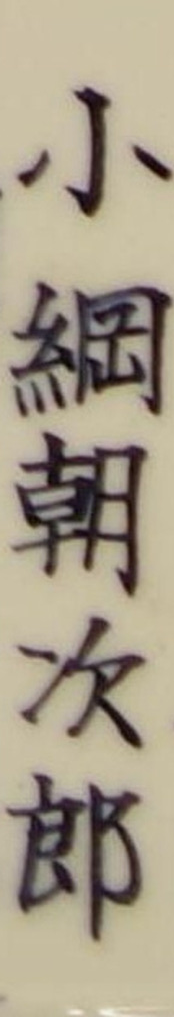小綱朝次郎
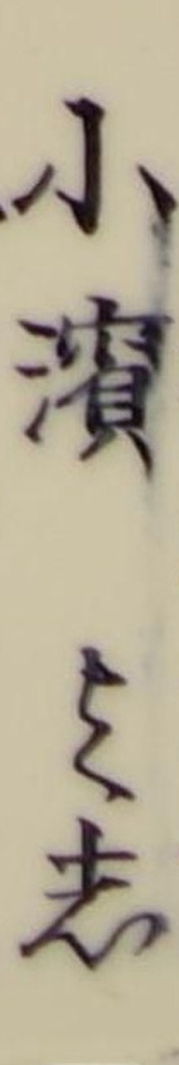小濱よし
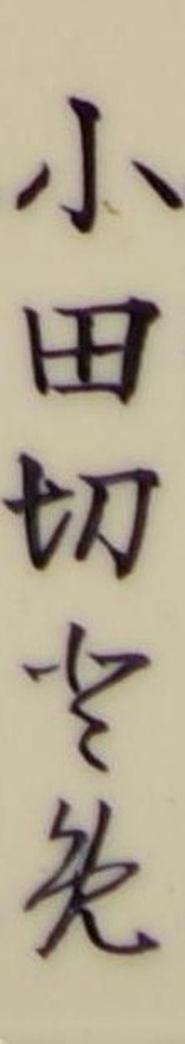小田切とめ
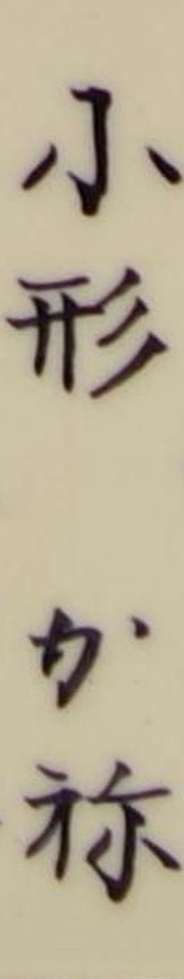小形かね
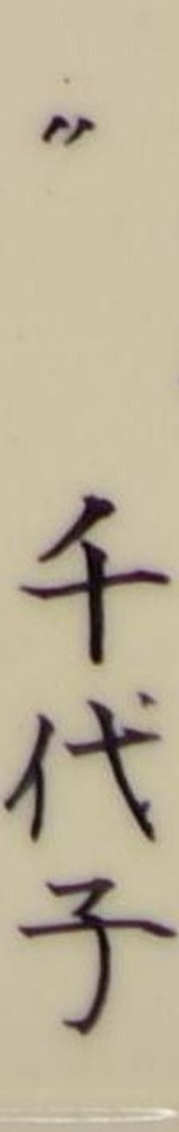千代子
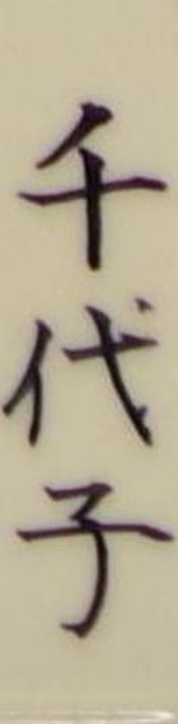千代子
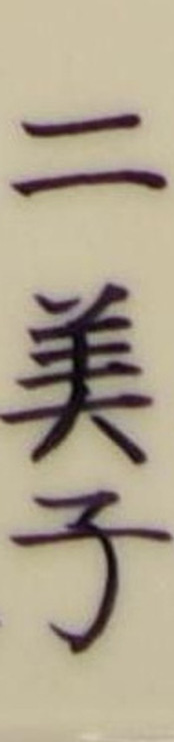二美子
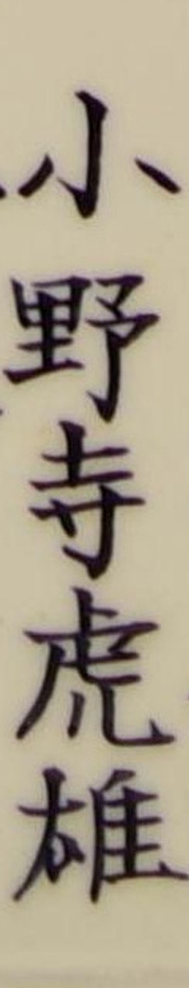小野寺虎雄
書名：E~L
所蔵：高野山金剛峯寺
